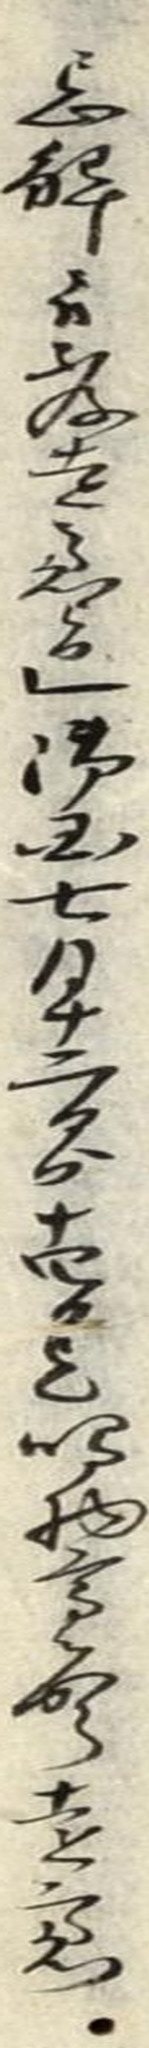忌解に付不及遠慮旨」御国七月十二日ゟ十四日迄鳴物高声遠慮
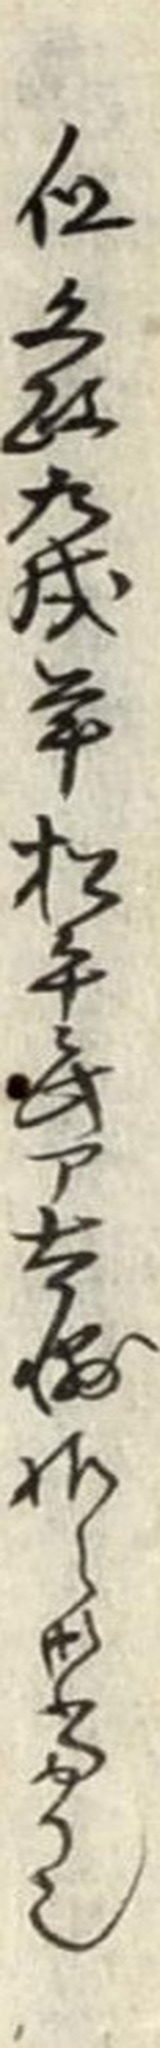但文政九戌年松平民部太輔様之御当り也
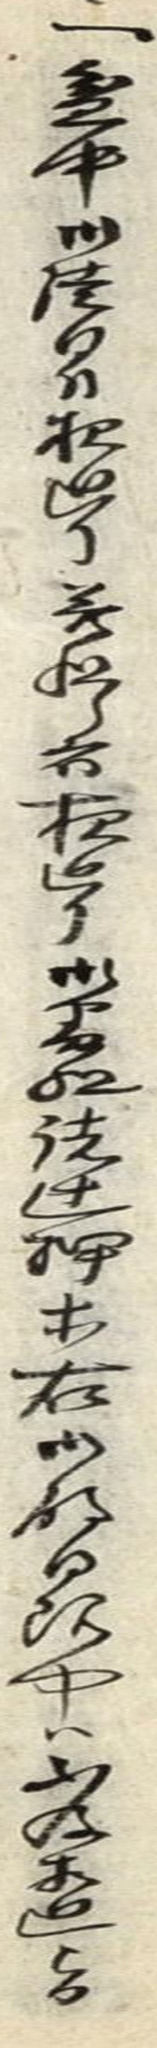一盆中御徒目付夜廻り并組之者夜廻り御番組諸辻押等右御触日限中は不及相廻旨
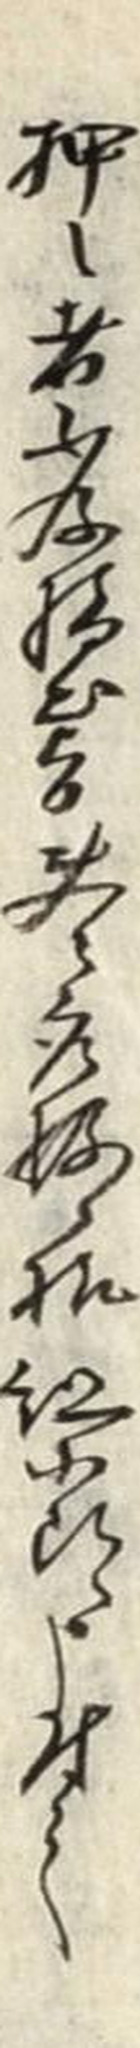押之者不及指出旨夫々取扱候様組小頭へ申付之
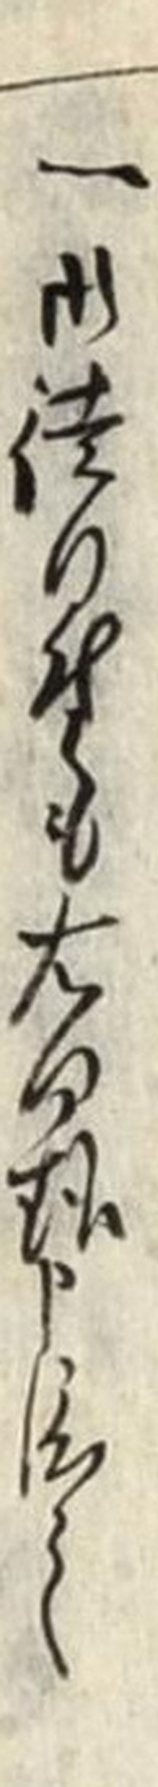一御徒目付も右同趣申渡之
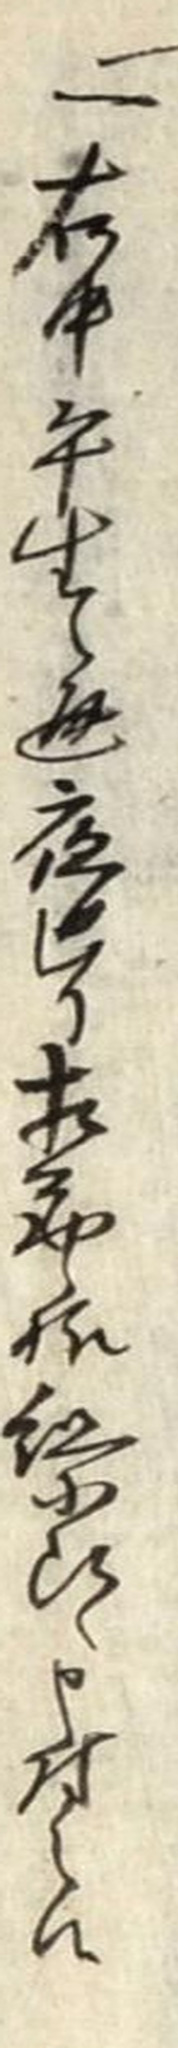一右中平生之通夜廻り相勤候様組小頭へ申付之候
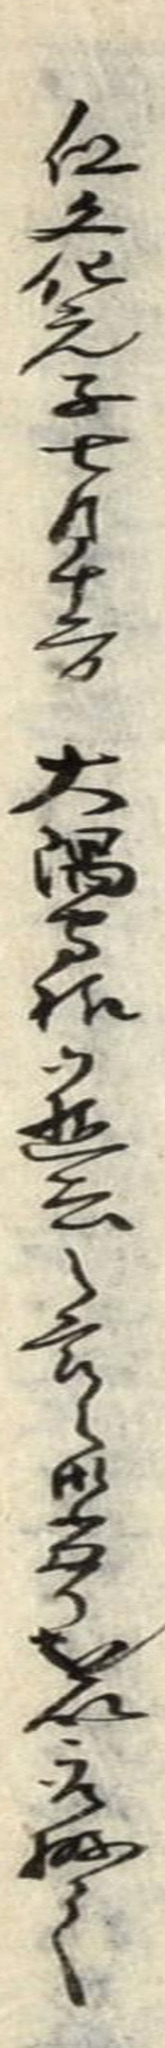但文化元子七月十二日大隅守様御逝去之節之御当りを以取扱之

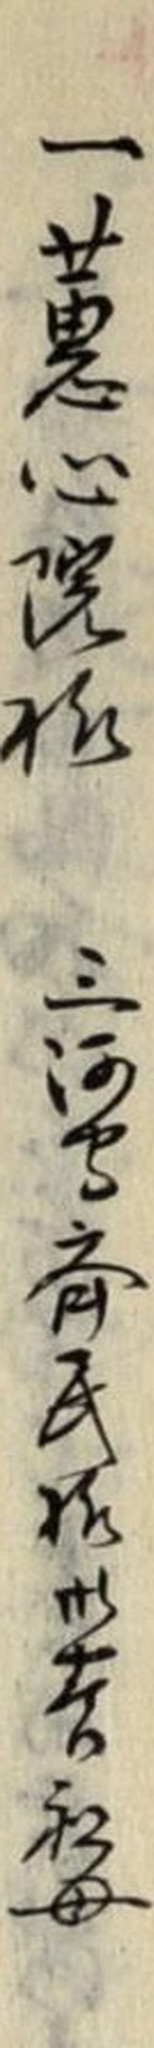一蕙心院様三河守斉民様御養祖母
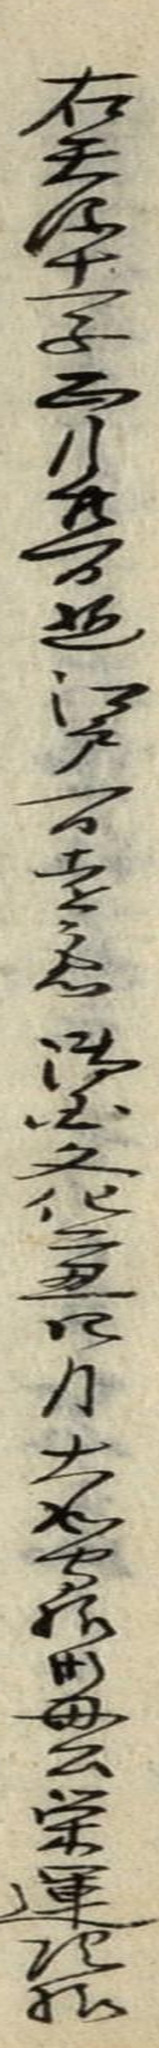右天保十一子正月廿一日逝江戸一日遠慮御国文化二丑四月大和守様御母公栄運院様
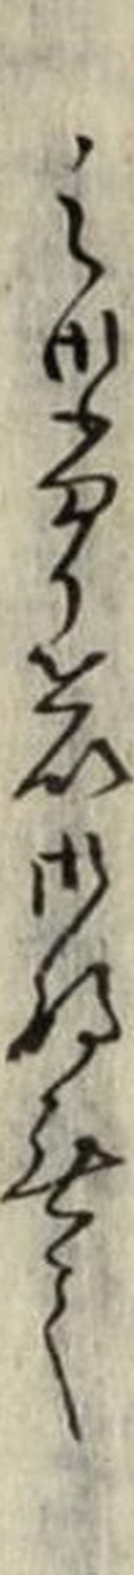之御当りを以御触無之
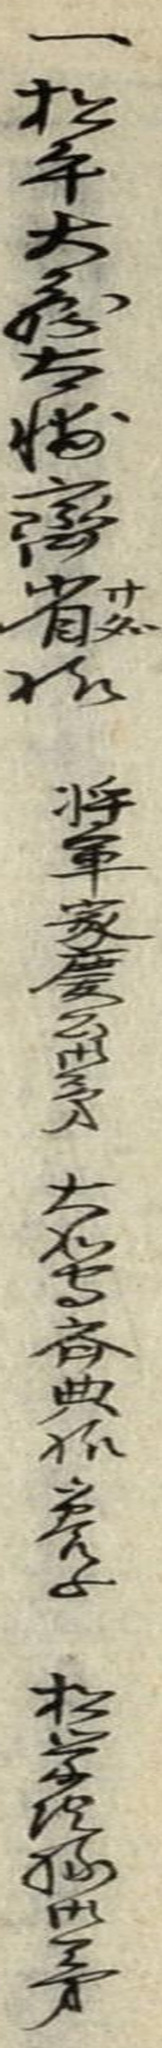一松平大蔵太輔斉省様将軍家慶公御弟大和守斉典様御養子松栄院様御弟
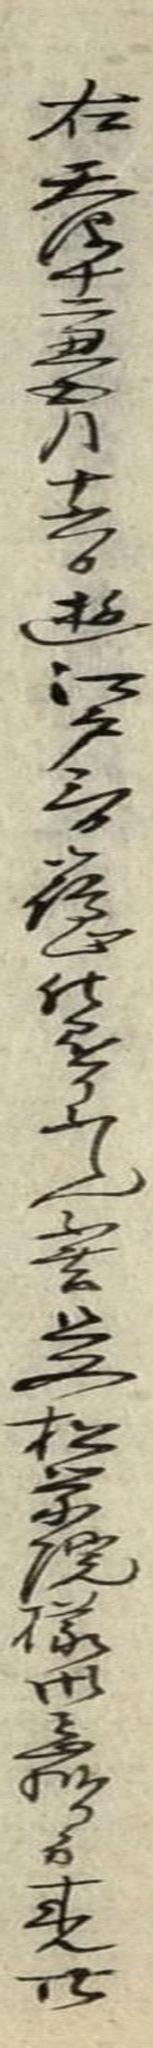右天保十二丑五月十六日逝江戸三日御停止仕懸りふしん不苦且又松栄院様御忌掛りに付来ル廿
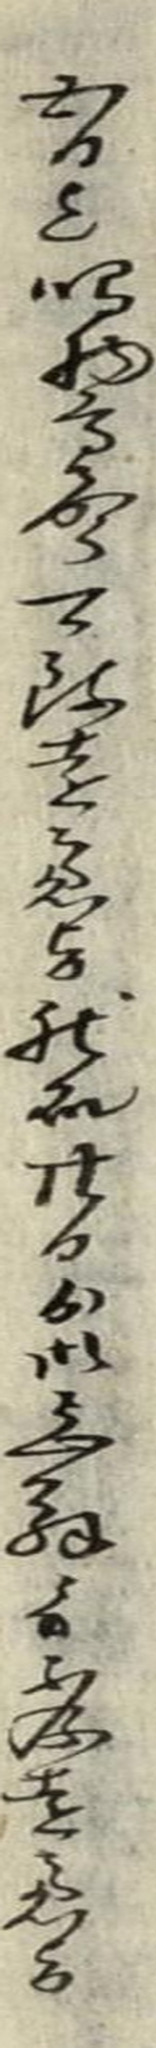五日迄鳴物高声可致遠慮旨然処廿日ゟ御忌解に付不及遠慮旨
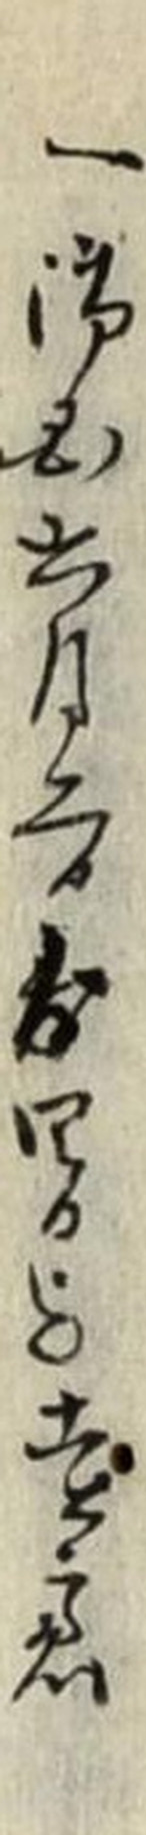一御国六月二日ゟ四日迄遠慮
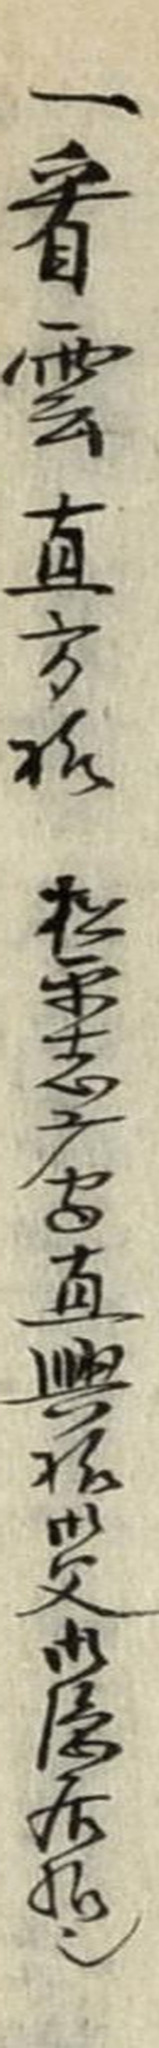一看雲直方様松平志摩守直興様御父御隠居様也
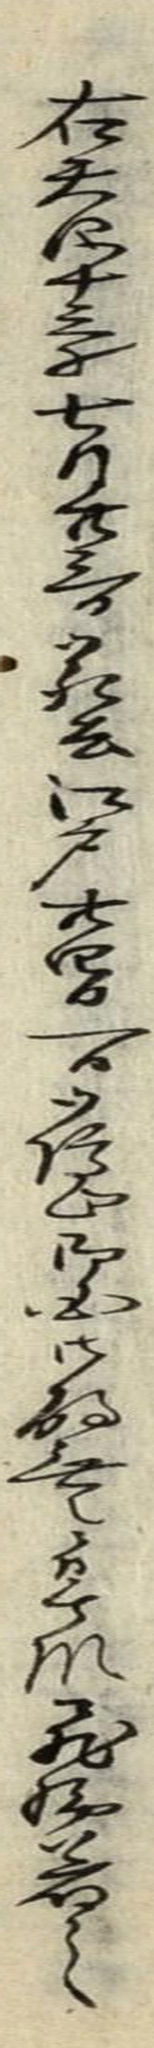右天保十三刁七月廿三日御死去江戸廿四日一日御停止御国御触無之に付其段飛脚着之
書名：御停止異変死失
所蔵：福井県文書館 Fukui Prefectural Archives
